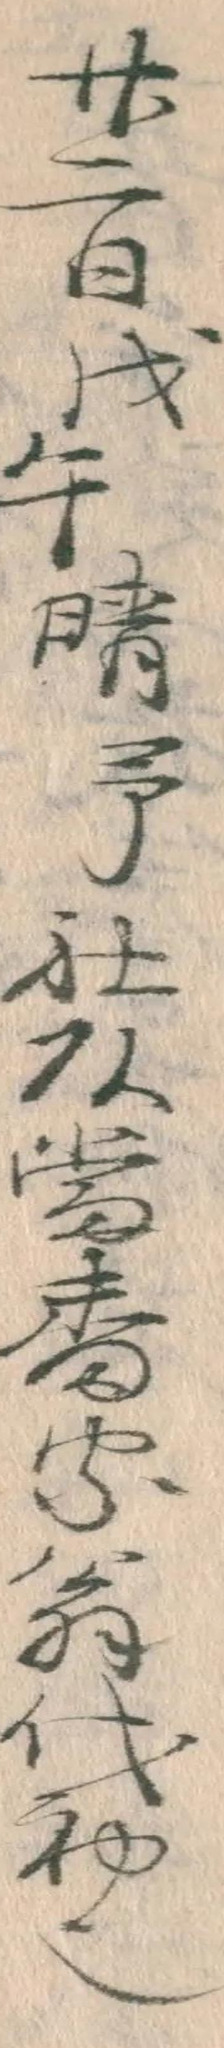廿二日戊午晴予社頭当番家翁代勤也
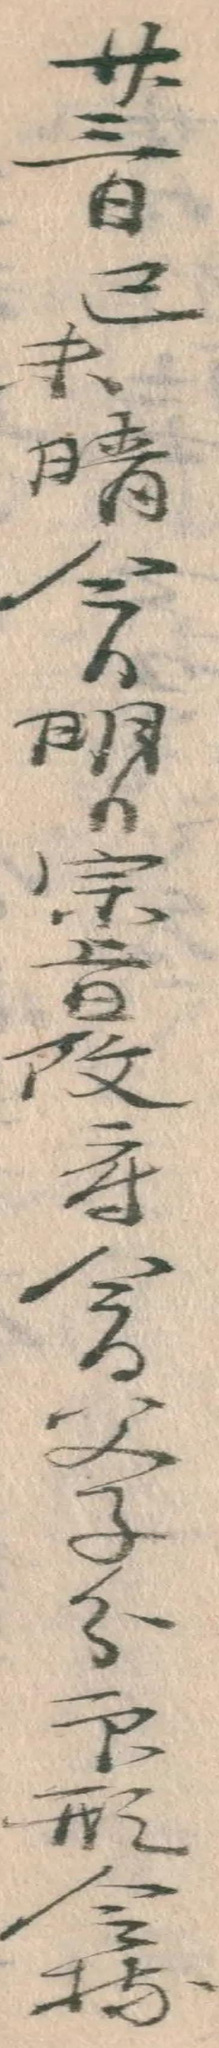廿三日己未晴今日明日宗旨改ニ付今日父子分印形令持
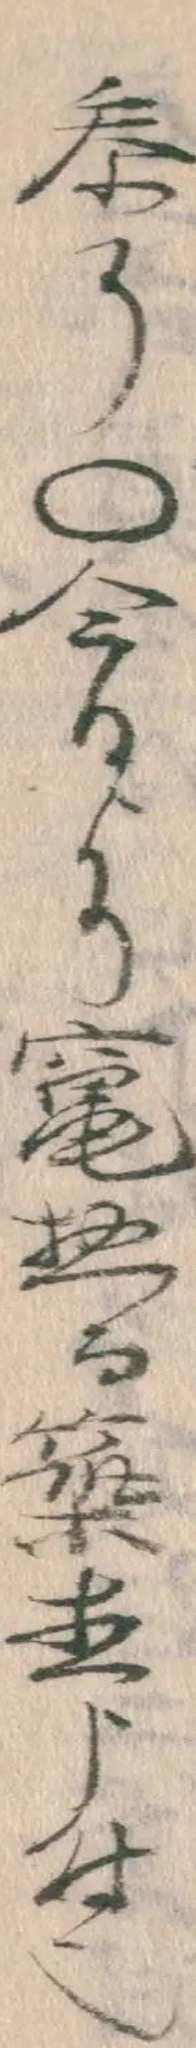参了○今日より竈惣而築直申付也
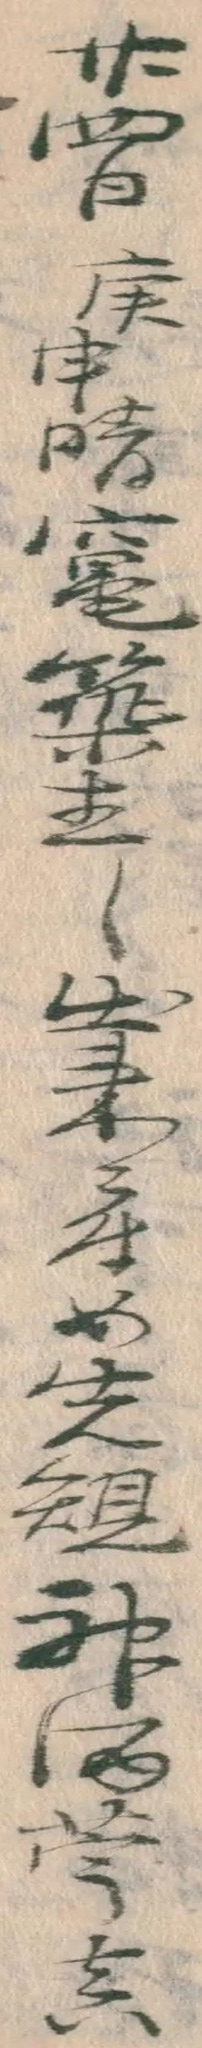廿四日庚申晴竃築直し出来ニ付如先規神酒苧真
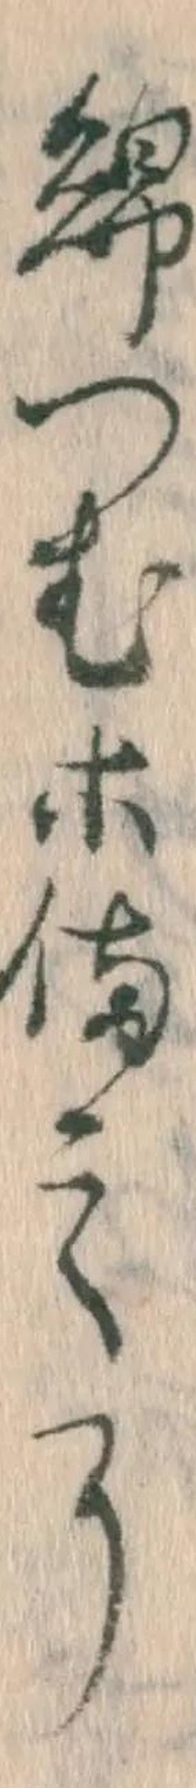綿つむ等備之了
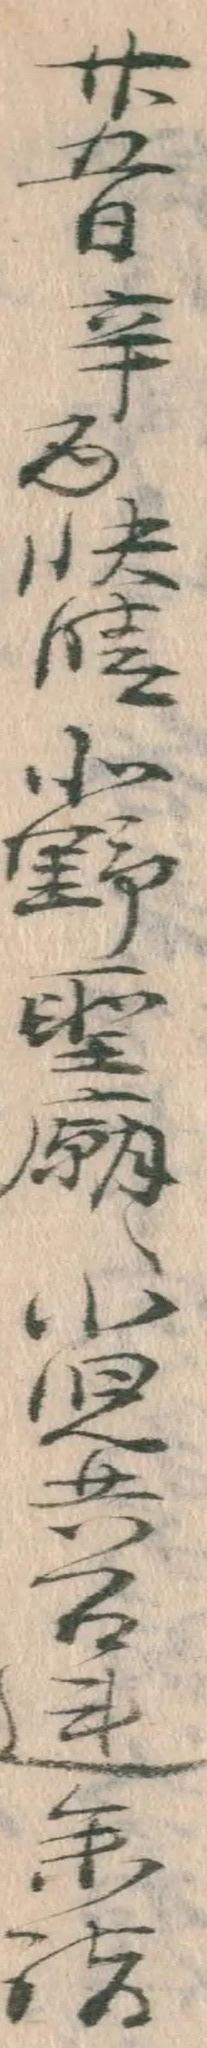廿五日辛酉快晴北野聖廟へ小児共召連参詣
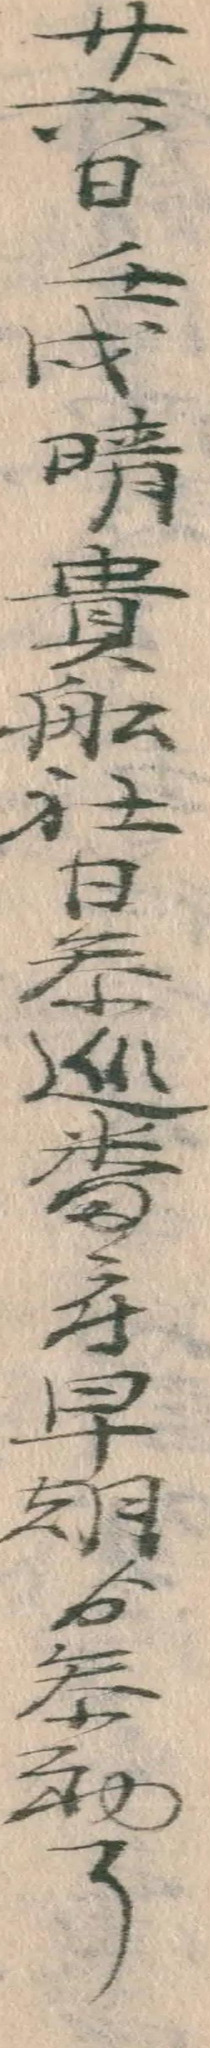廿六日壬戌晴貴船社日参巡番ニ付早朝ゟ参勤了
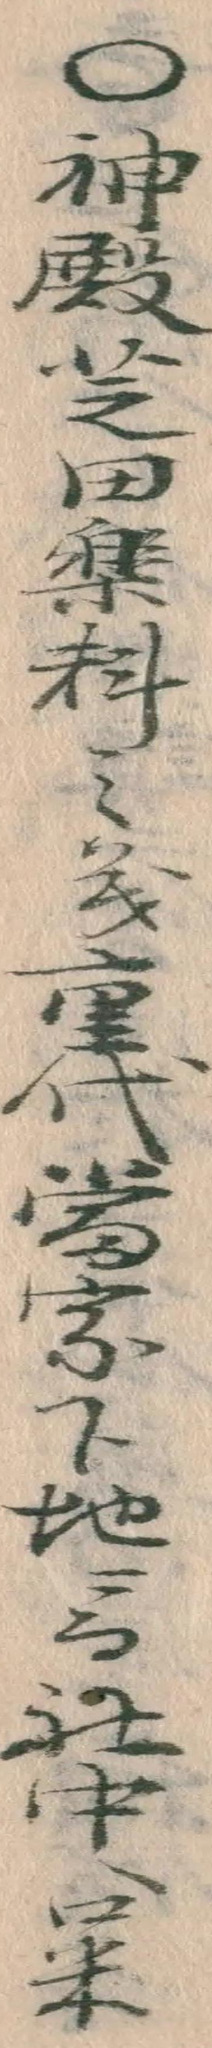○神殿芝田楽料之義重代当家下地ニ而社中へ口米
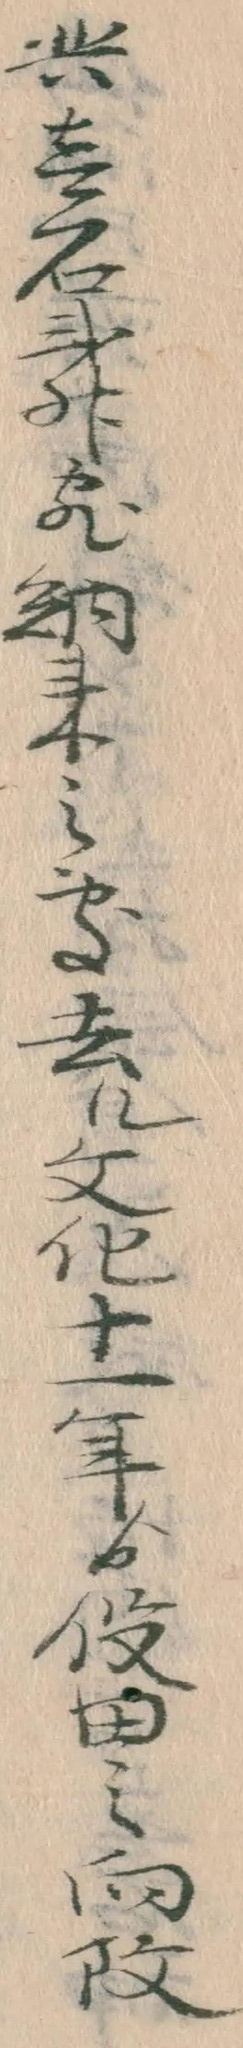共壱石弐升宛納来之処去る文化十一年ゟ役田之向改
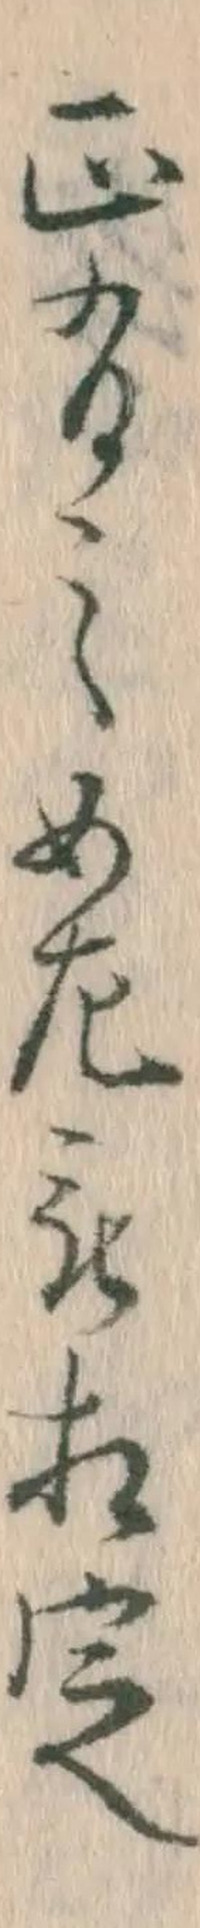正有之如左被相定
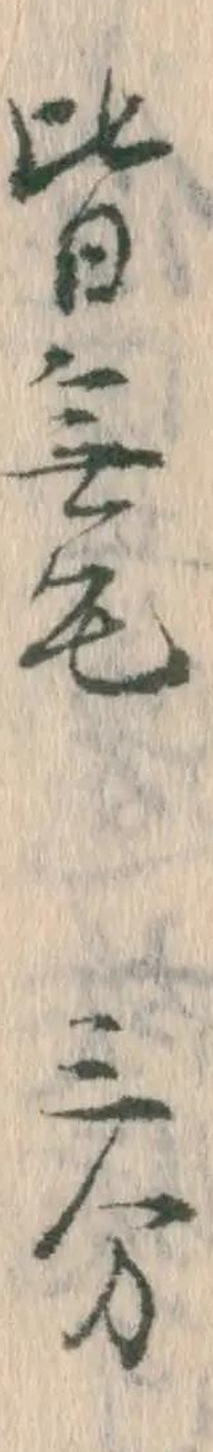皆無毛三分
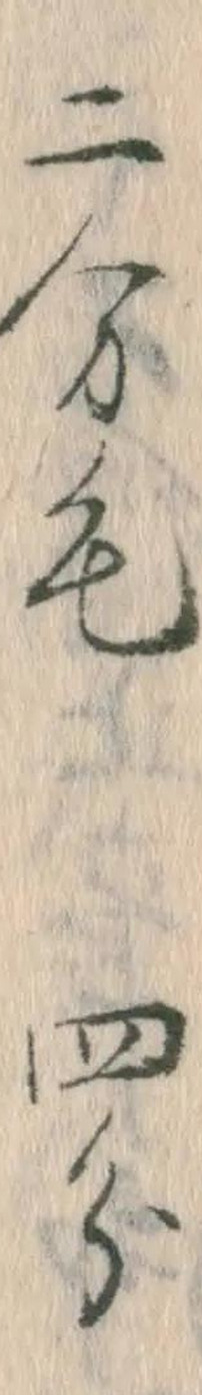二分毛四分
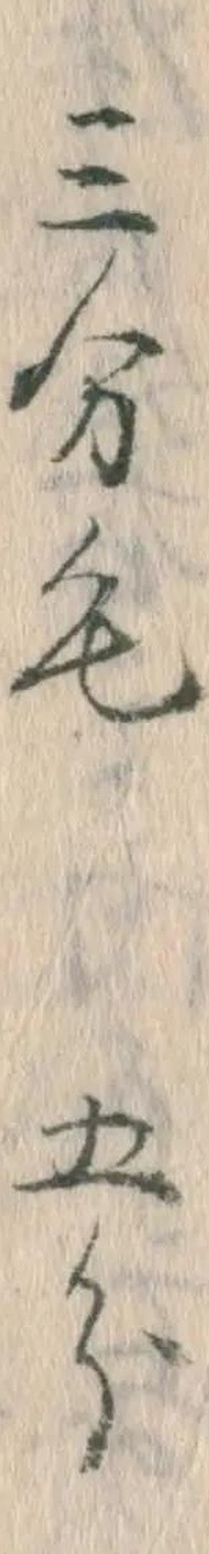三分毛五分
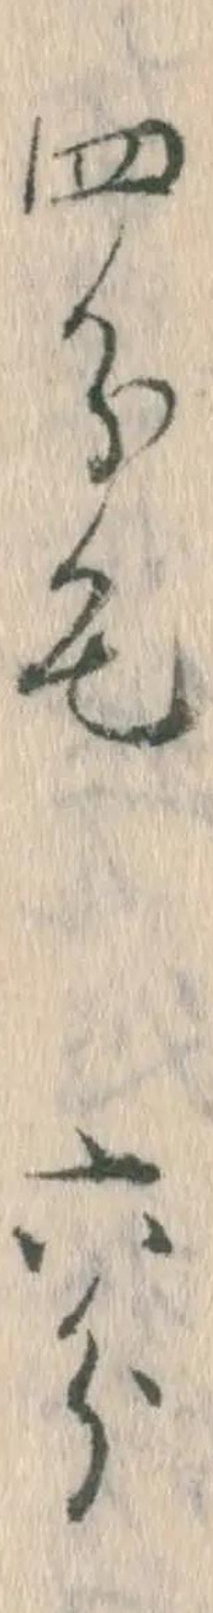四分毛六分
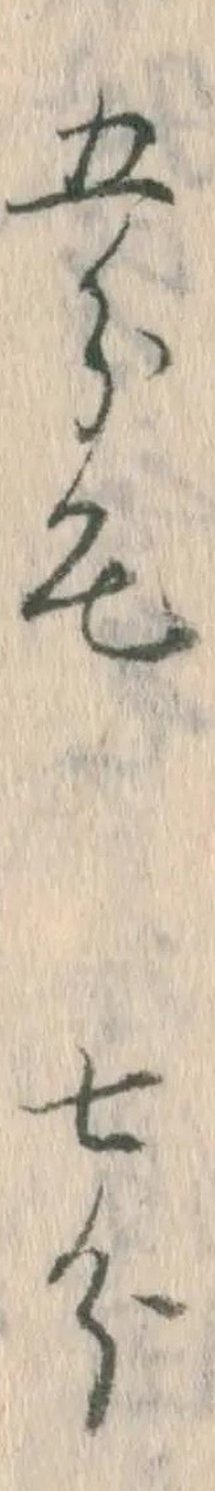五分毛七分
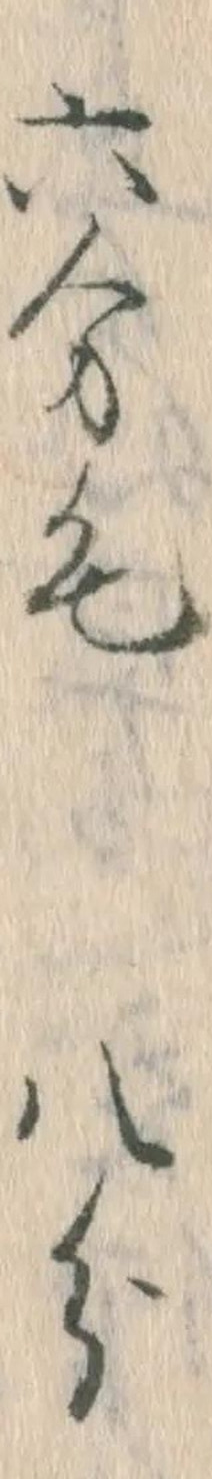六分毛八分
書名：賀茂社記録. 第64冊
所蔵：国立国会図書館 National Diet Library, JAPAN
